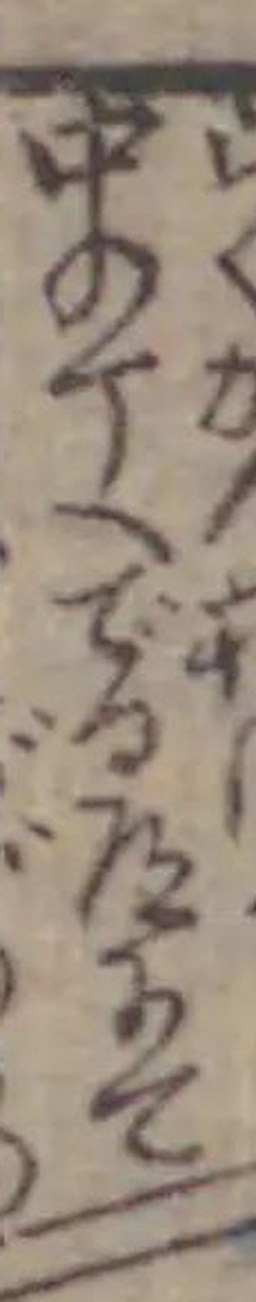中の丁へでる道にて
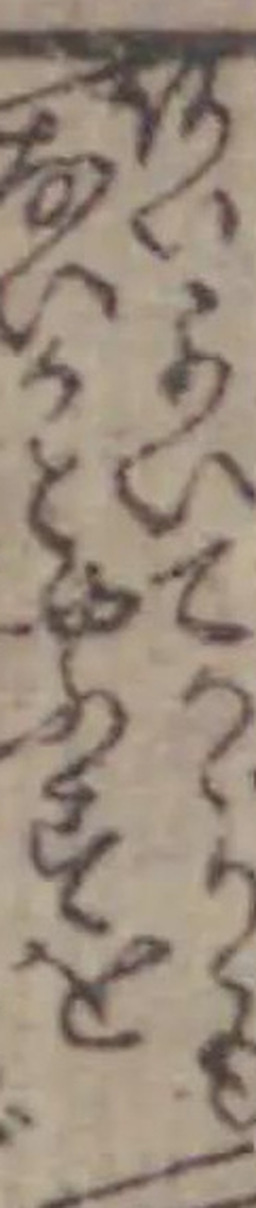ないかとやふすを
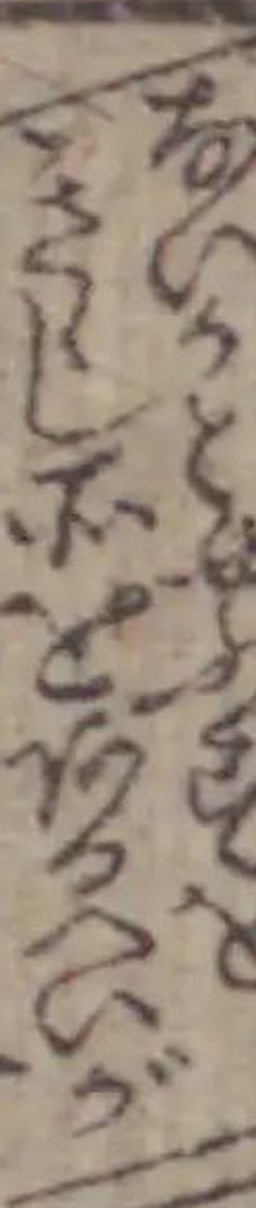きゝし所をあるへいが
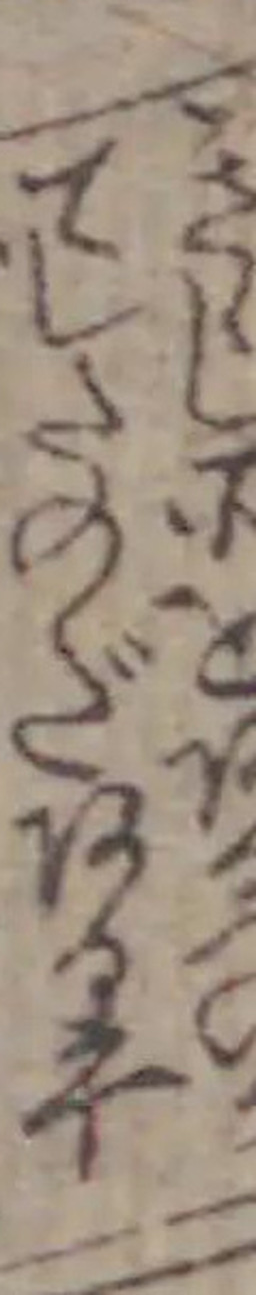てしたのだある平
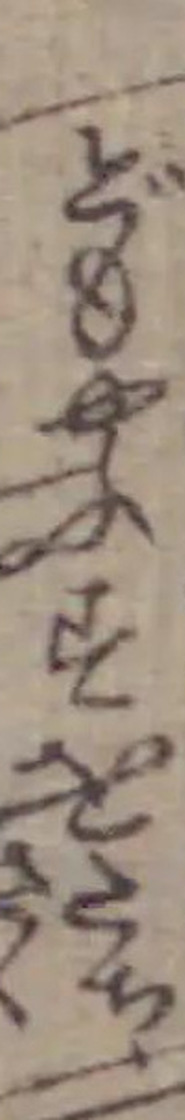どもやふすをたち

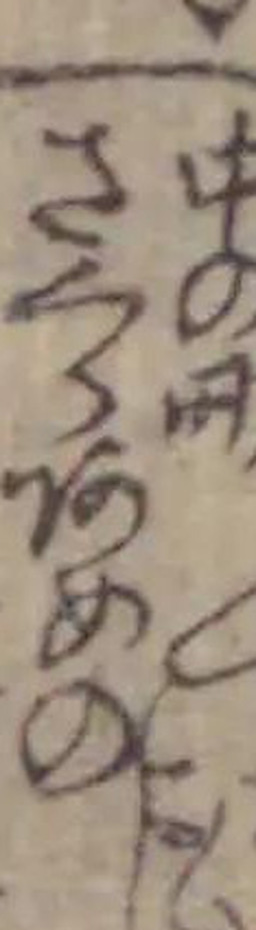さくらあめの
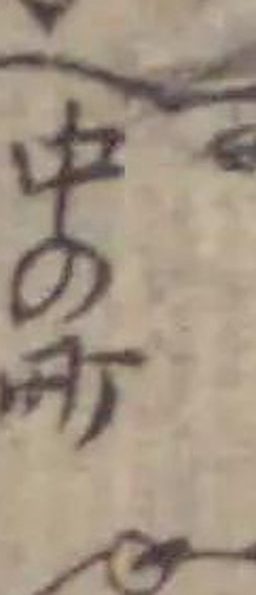中の町
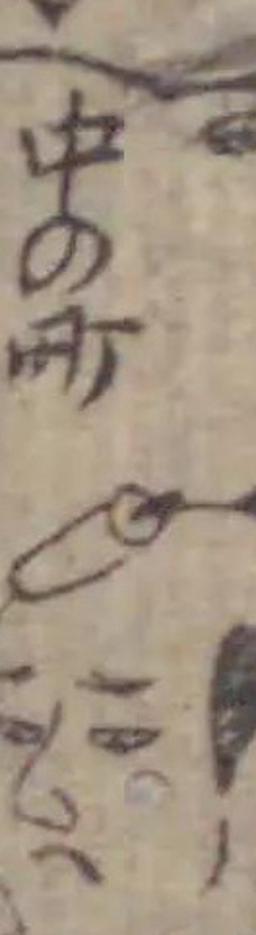中の町
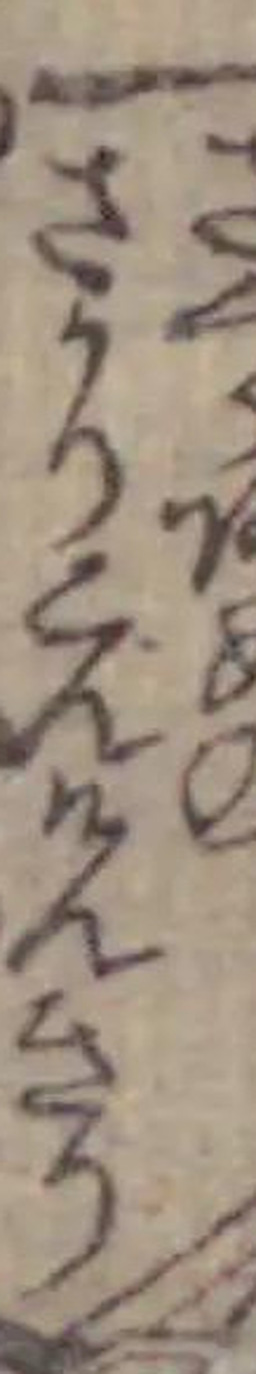さかりこんけんきり
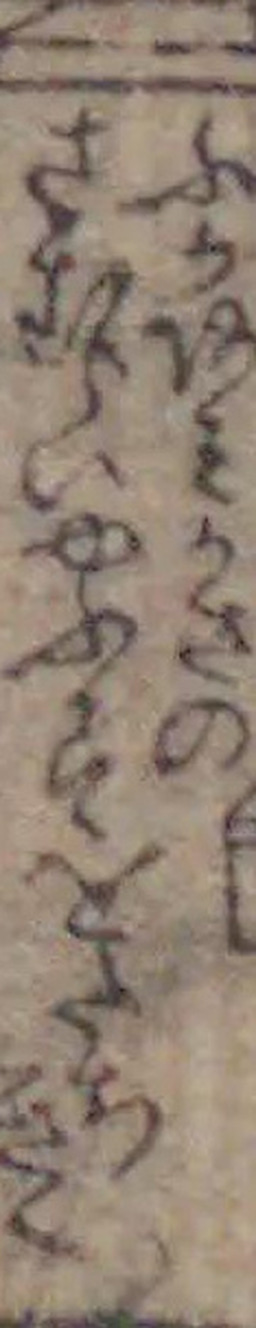さむらいやふすをたちきく
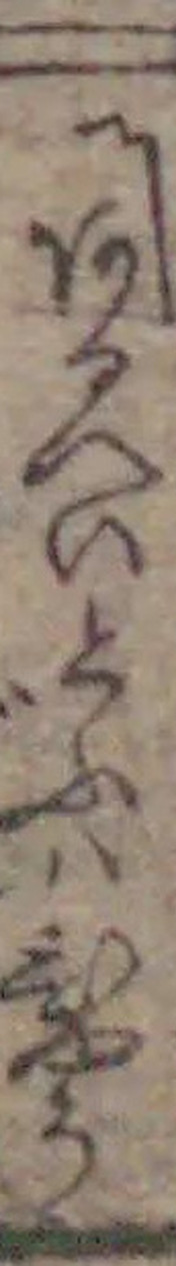〽あるへいとふはひやう
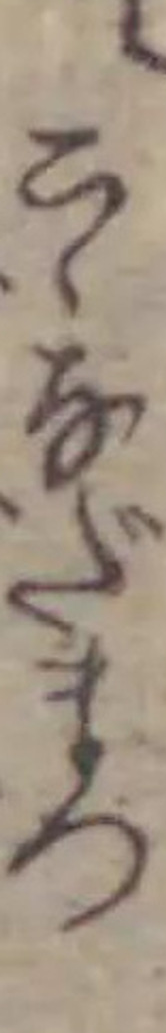ここなだまつ
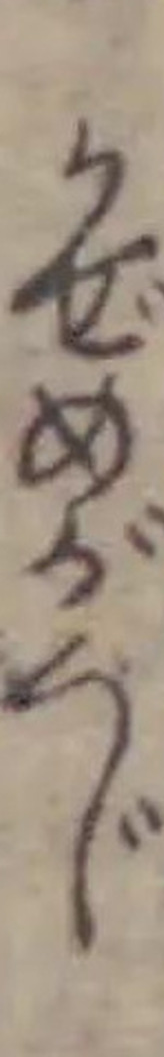かぜめがくじ
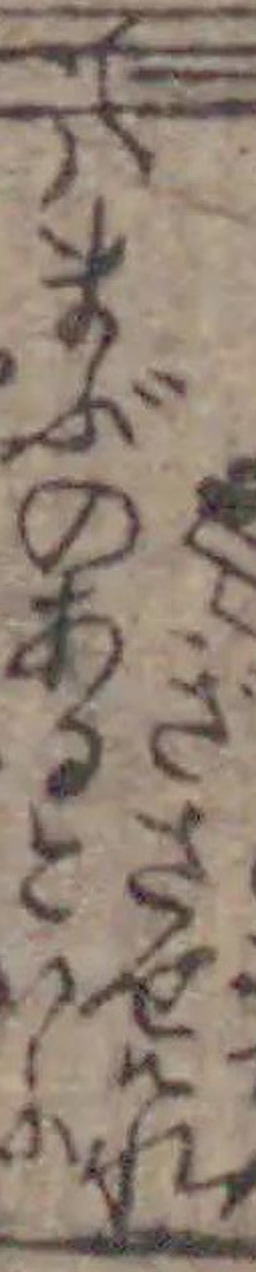はまぶのあるといふ
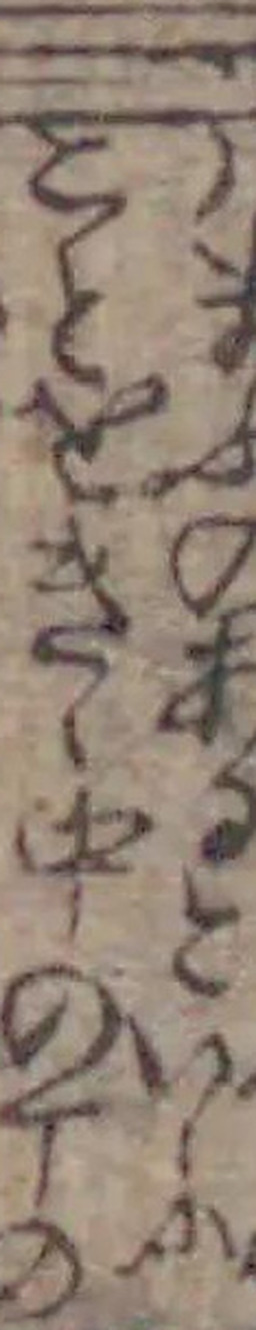ことをきゝ中の丁の
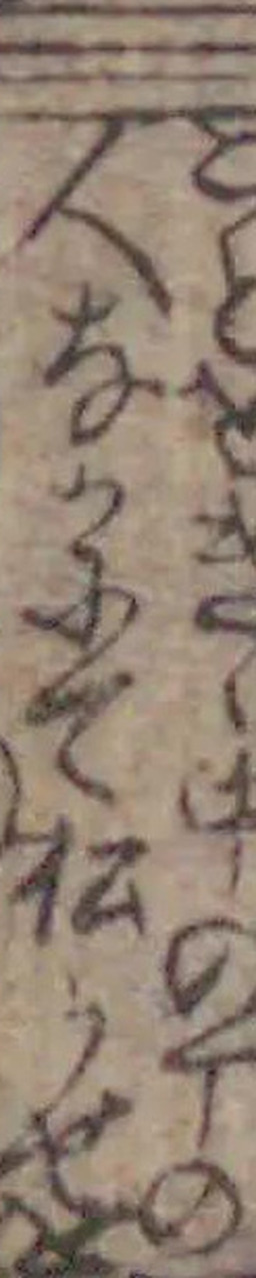人なかにて松かせを
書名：名代干菓子山殿 3巻
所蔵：国立国会図書館 National Diet Library, JAPAN
